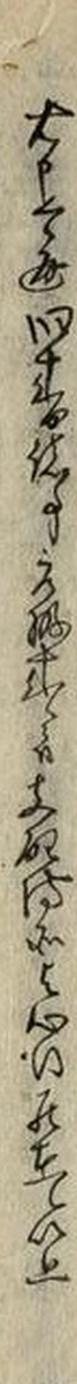右申上候通旧来ゟ諸事取扱来候に付支配場所と心得罷在候以上
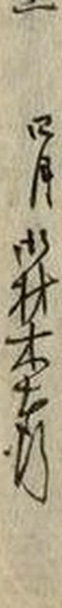四月御材木奉行
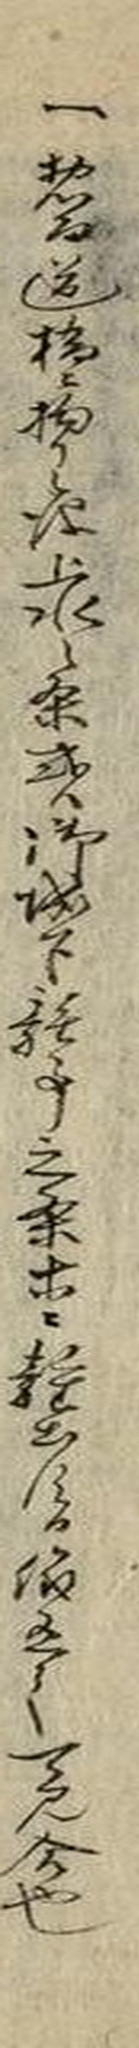一惣て道橋に拘り候儀上水之条或は御城下雑事之条等々雑出する儀有之可見合也
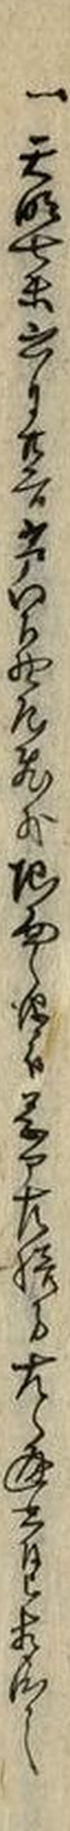一天明七未六月廿二日芦田下野屋敷外地面之儀に付岡部左膳方左之通書付被相渡之
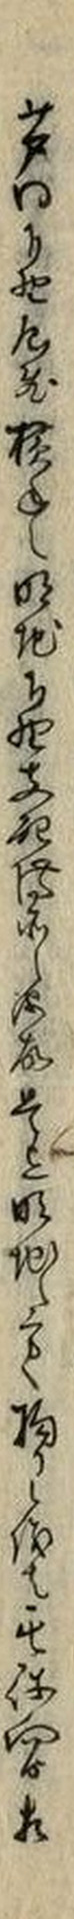芦田下野屋敷横手之明地下野支配場所之儀故是迄明地之方へ拘り候儀は其役向ゟ相
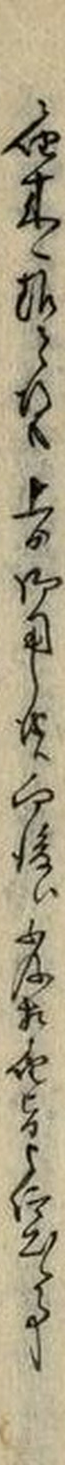届来候趣に候得共上ゟ御用之儀は向後は不及相届旨被仰出候事
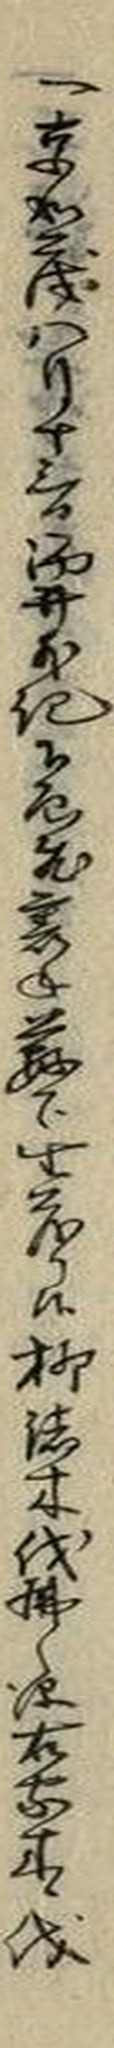一享和二戌八月十三日酒井外記下屋敷裏手薮下生茂り候柳諸木伐払之儀右家来へ伐
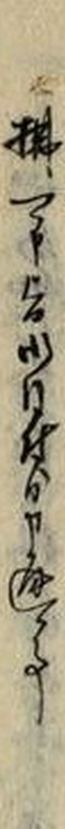払可申旨御目付ゟ申通候事
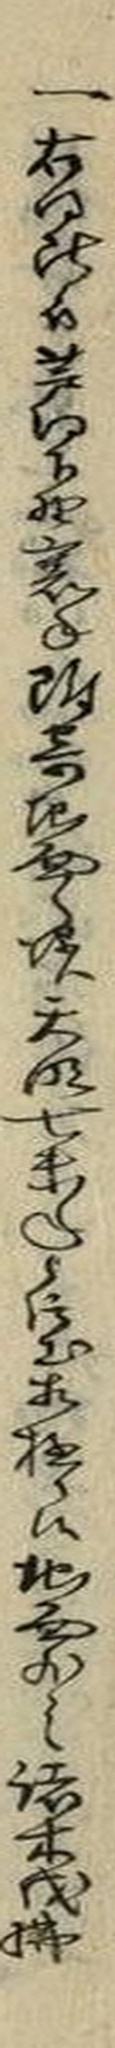一右同断に付芦田下野裏手附寄地面之儀は天明七未年被仰出相極り候地面外之諸木伐払
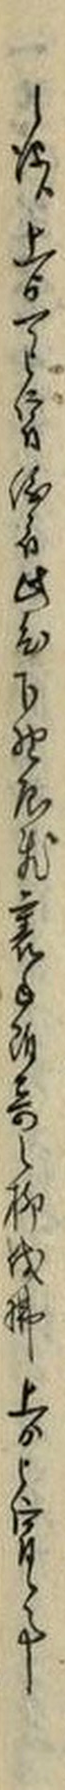之儀は上ゟ可被仰付儀に付此度下野屋敷裏手附寄之柳伐払上ゟ被仰付候事
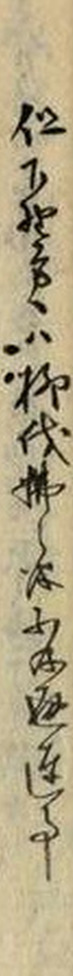但下野方へは柳伐払之儀不及通達事
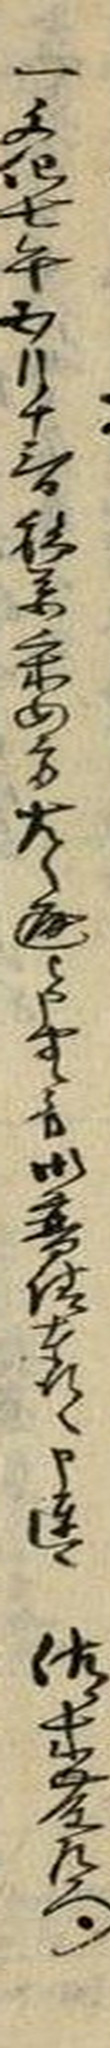一文化七午五月十三日稲葉采女方左之通被申聞に付御普請奉行へ申達候佐々木藤左衛門
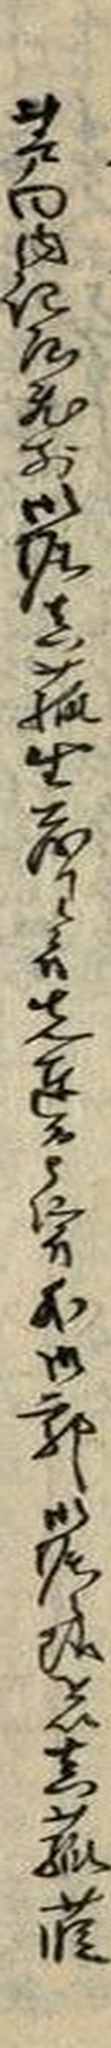芦田内記屋敷前御堀真菰生茂り候に付先達て被仰付外御郭御堀之趣を以真菰葭
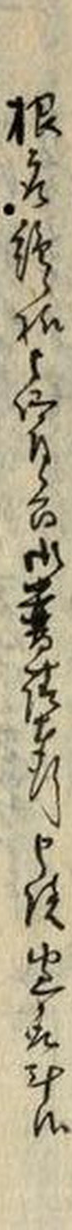根取絶候様被仰付候間御普請奉行申談置取斗候
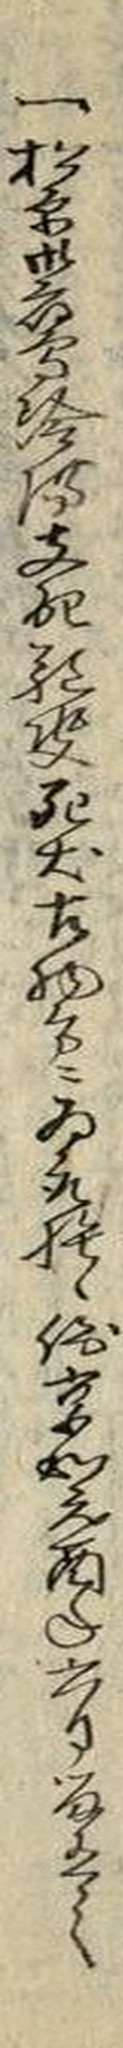一松原御鷹冷場支配難決死犬古物方に為取捨候儀享和元酉年六月留有之
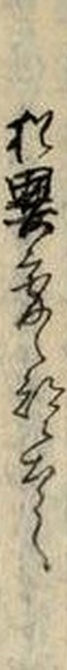猶異変之部に出之
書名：御城下諸事之部
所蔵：福井県文書館 Fukui Prefectural Archives
